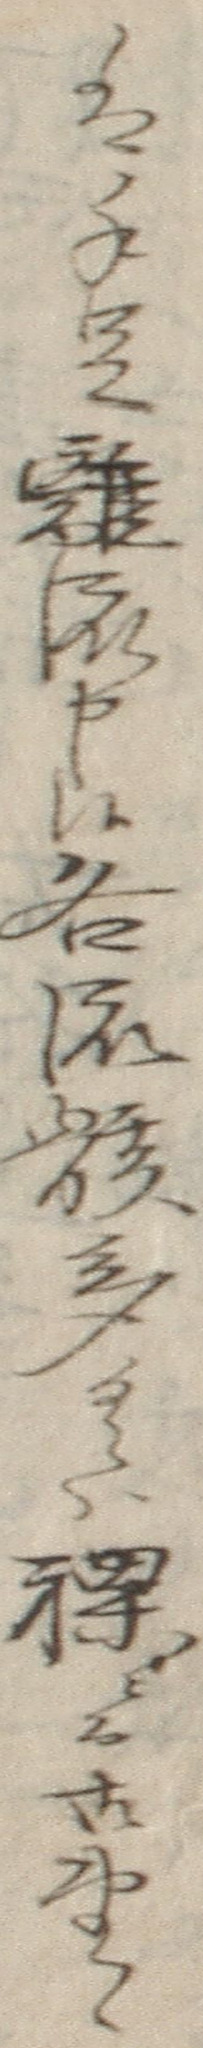は手足離流申候各流骸多くハ裸に而御座候
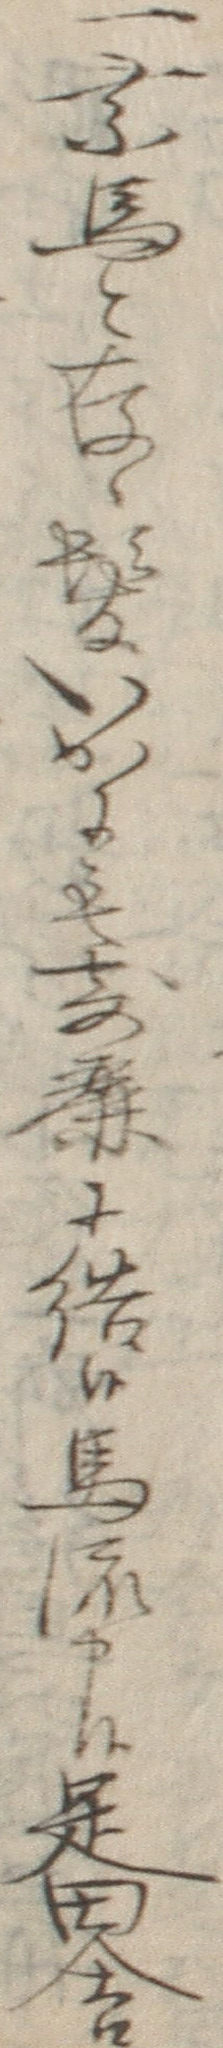一乗馬と存候髪いかにも素廉に結候馬流申候是田舎
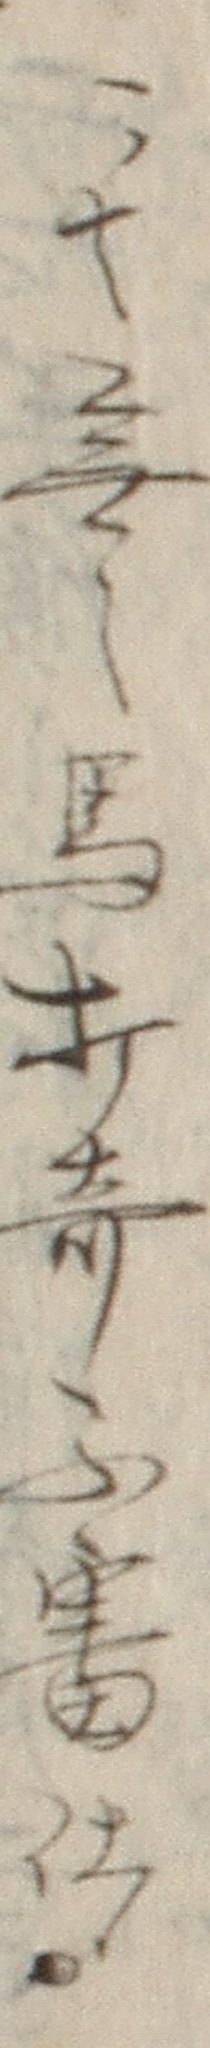は無之馬打寄不審仕候
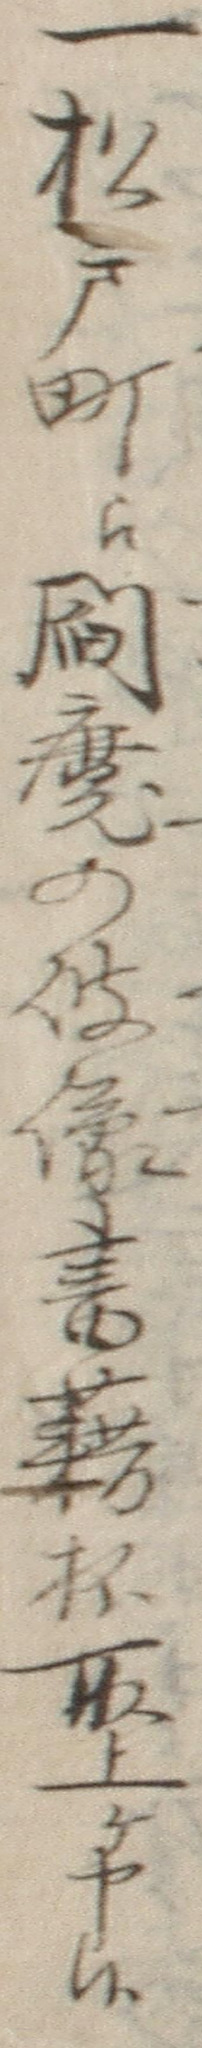一松戸町え閻魔の破像書籍抔取上ケ申候

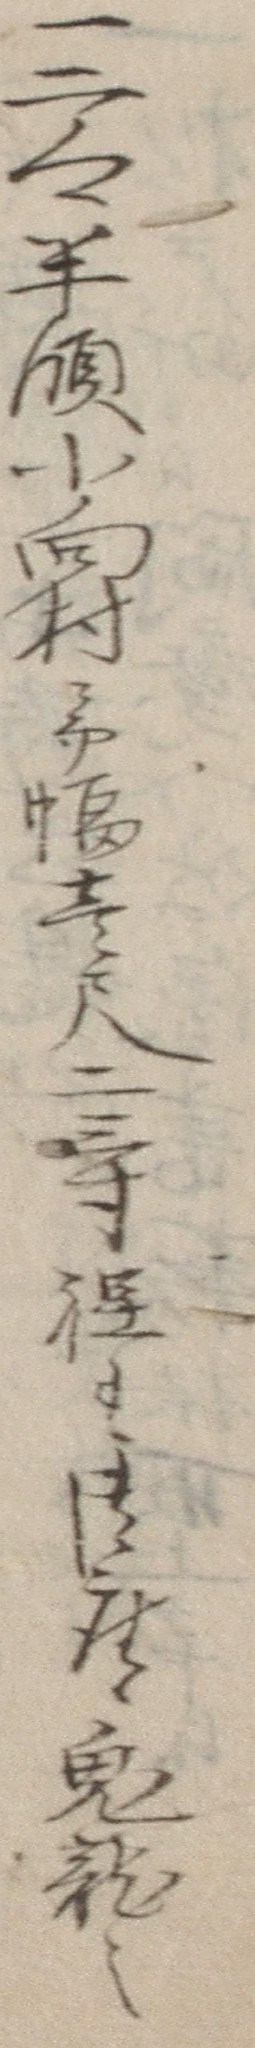二郷半領小向村ニ而幅壱尺二三寸程も御座候鬼龍之
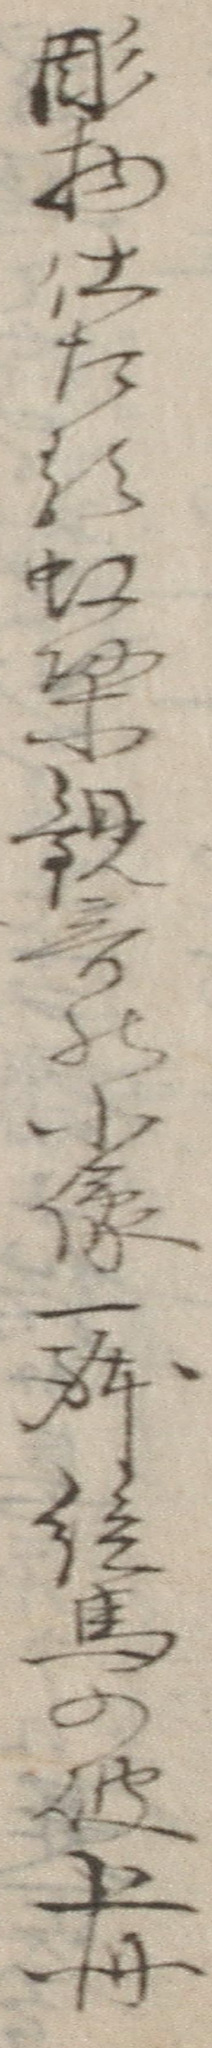彫物仕たる虹梁観音の小像一躰絵馬の破上州
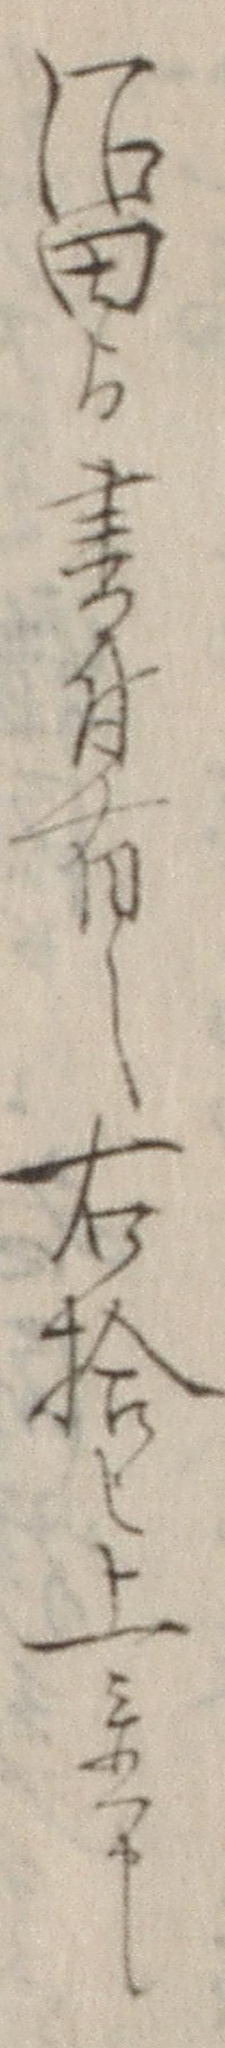沼田ゟ書付有之右拾候上参可申候
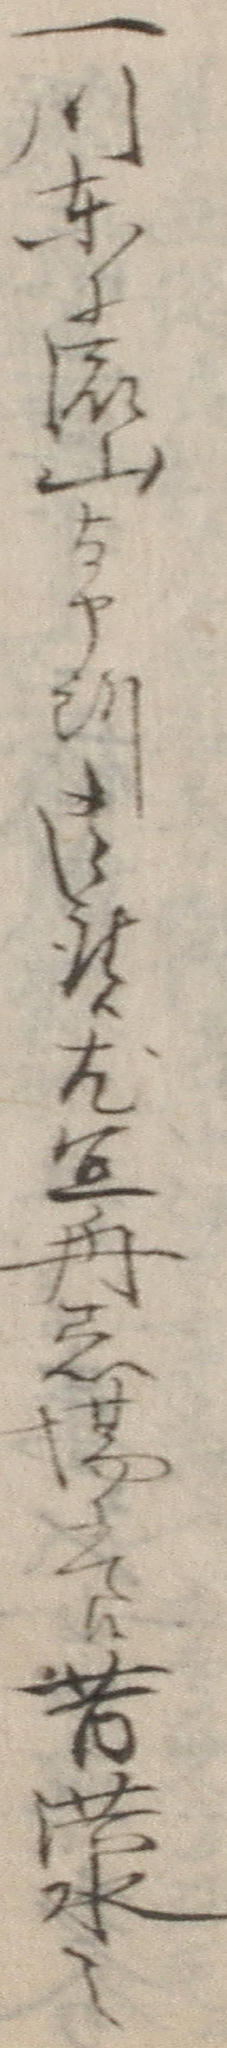一川東に流山と申所御座候尤宜舟着場にて候昔洪水之
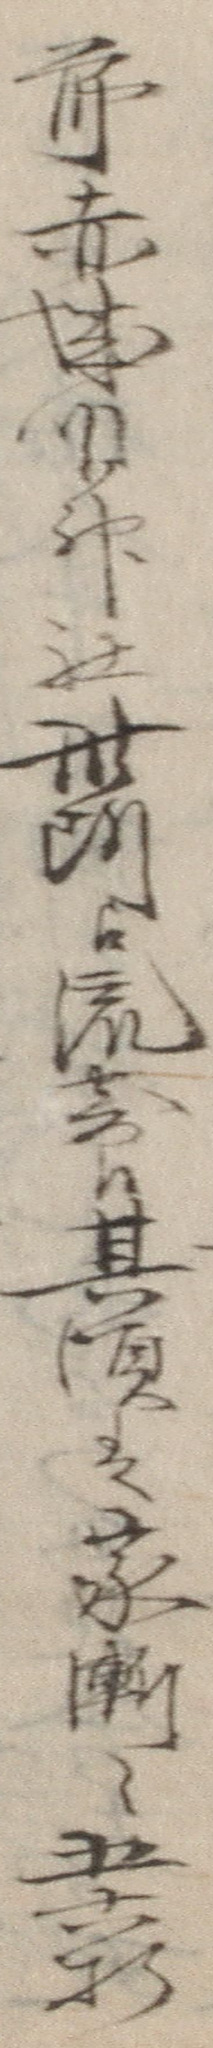節赤城明神社此所え流寄候其頃は家漸々五六軒
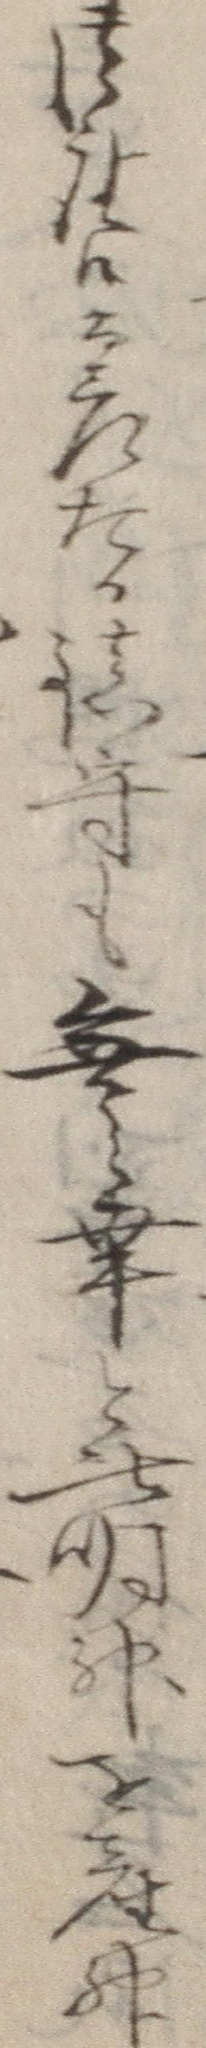御座候而差たる鎮守も無之畢と此明神を産神
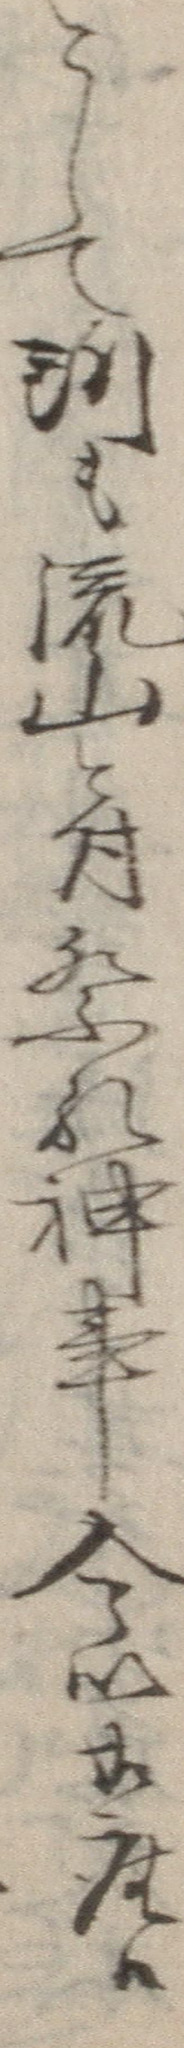として所も流山と付祭礼神事今以御座候
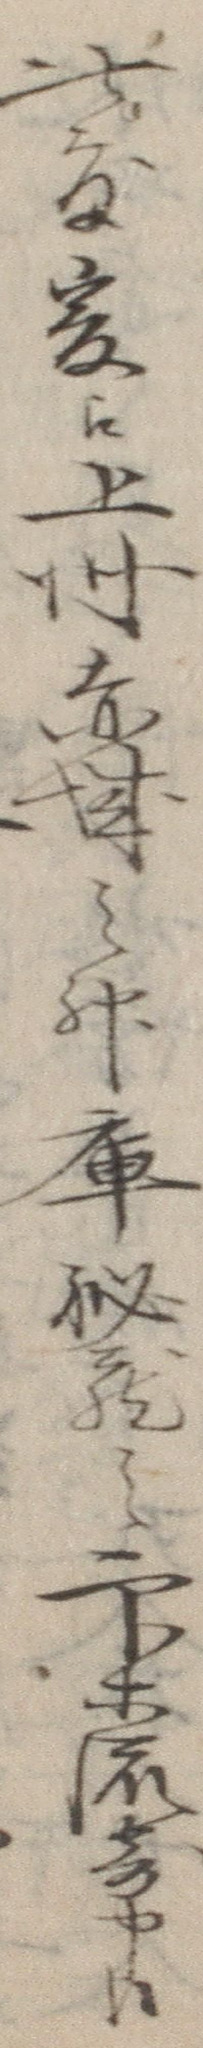此度爰え上州赤城之神庫秘蔵之印等流寄申候
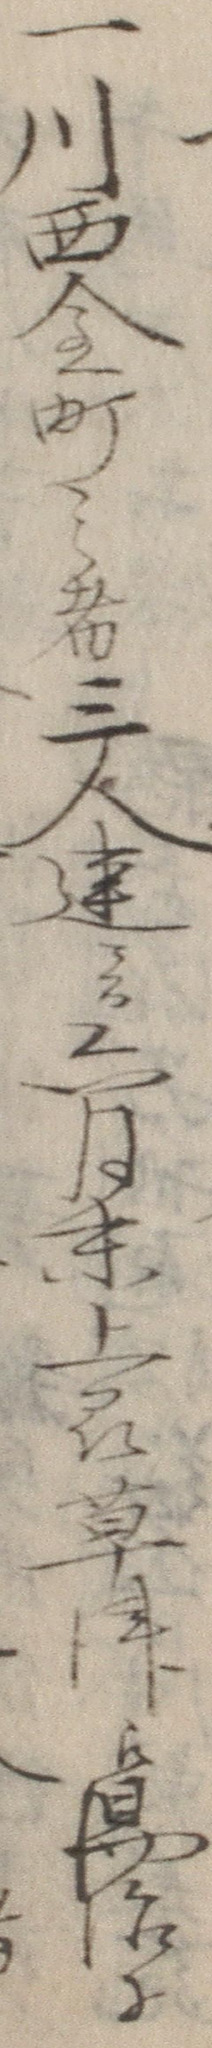一川西金町之者三人連ニ而六月末上州草津え湯治に
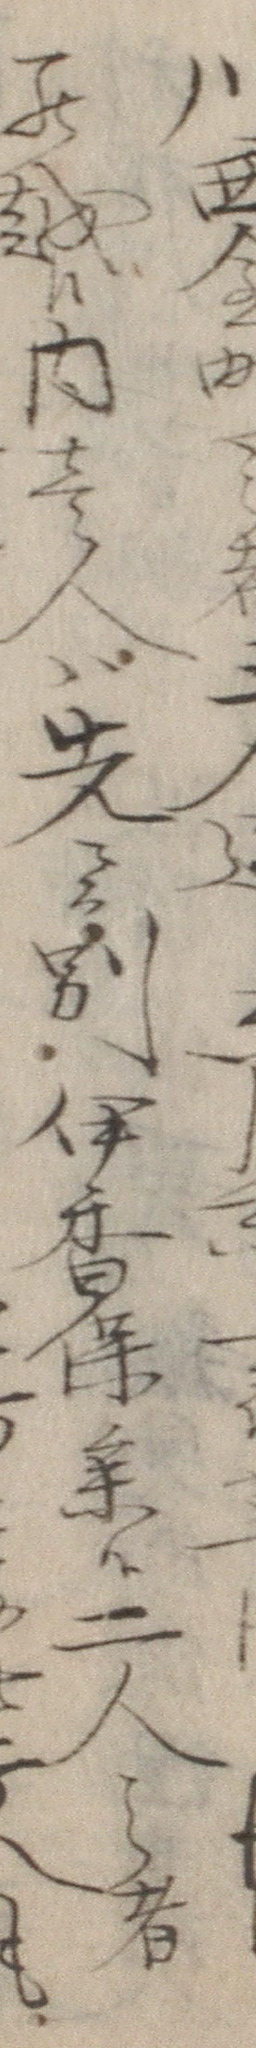罷越候内壱人ハ先ニ而別伊香保参候二人之者
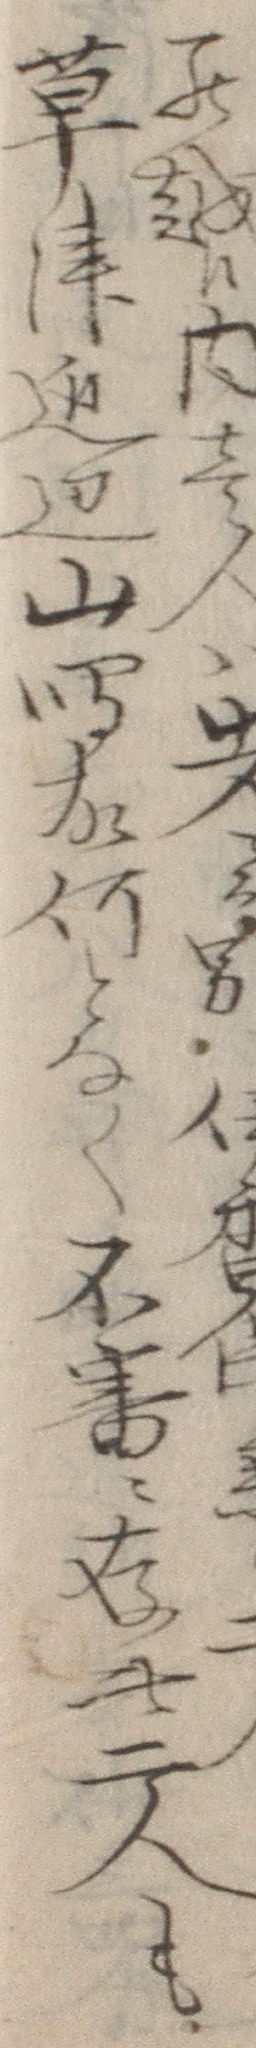草津近辺山鳴故何となく不審ニ存此二人も
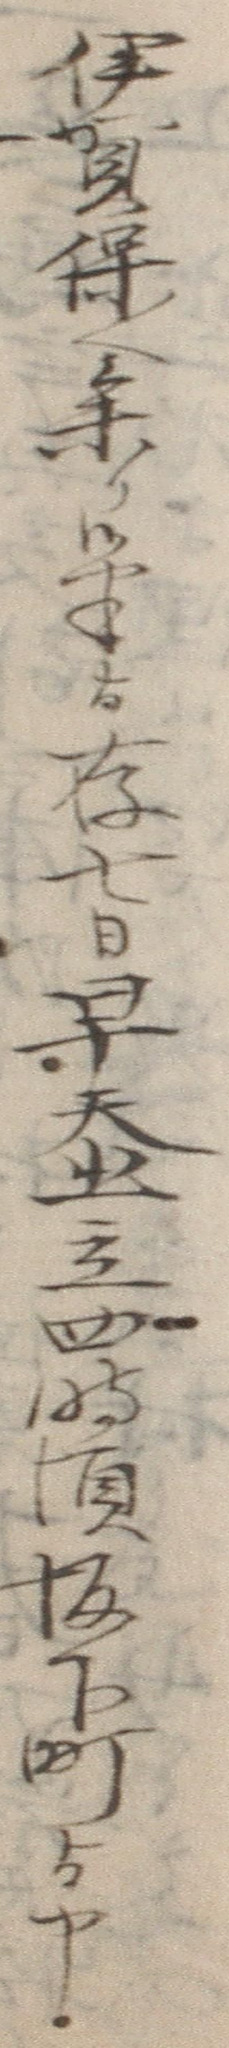伊香保へ参り候半と存七日早天出立四時頃坂下町と申
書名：[諸国災害記録]
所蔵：東京大学地震研究所図書室 Earthquake Research Institute Library, The University of Tokyo, JAPAN
